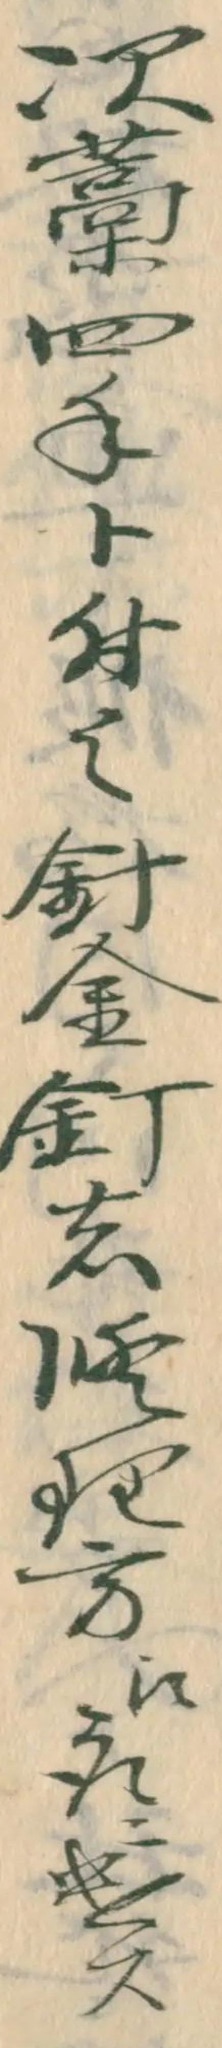次藁四手ト付之針金釘者修理方江取遣ス

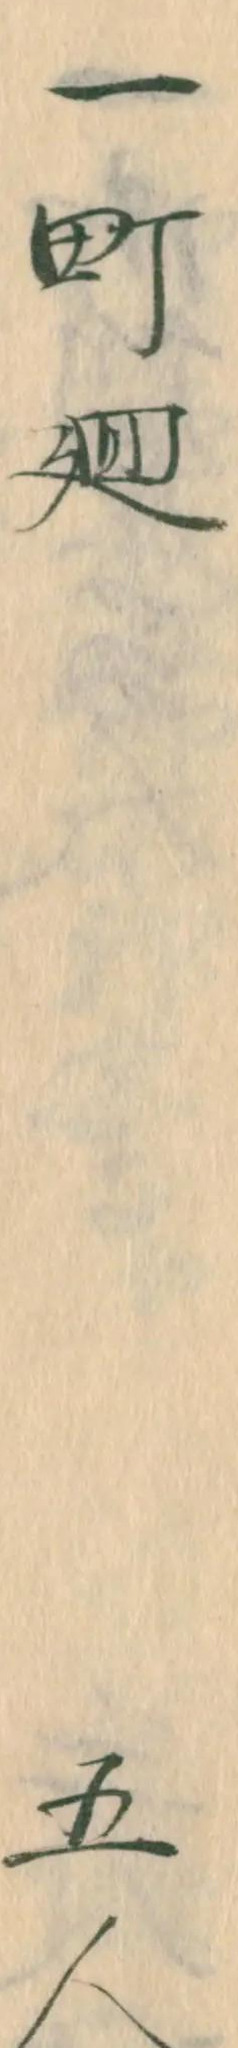一町廻五人
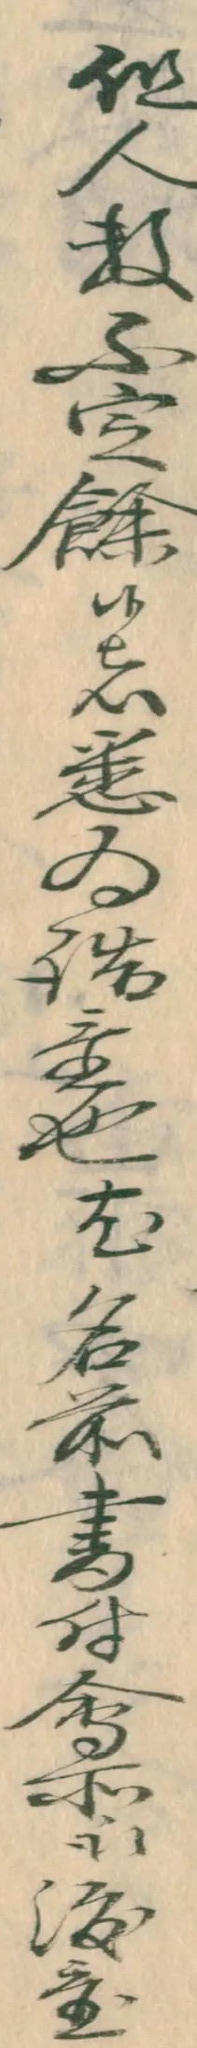但人数不定余候者悉為詰置也尤名前書付会所に渡置
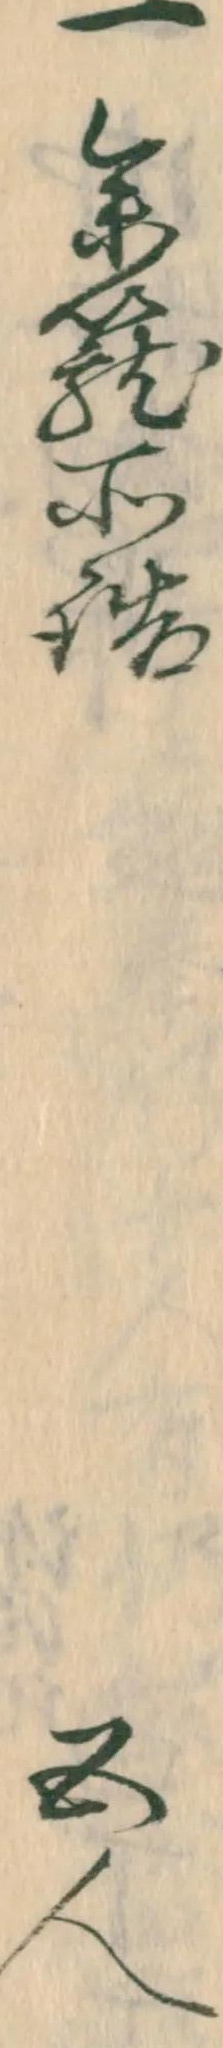一参籠所詰五人
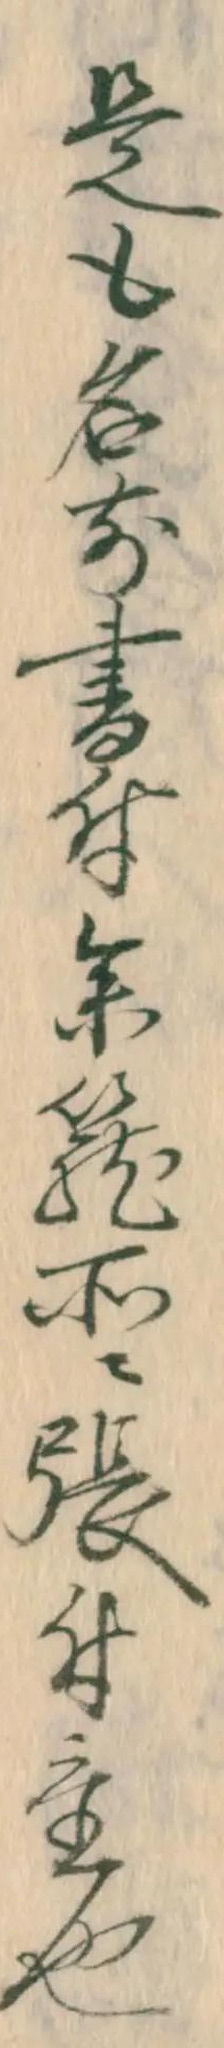是も名前書付参籠所ニ張付置也
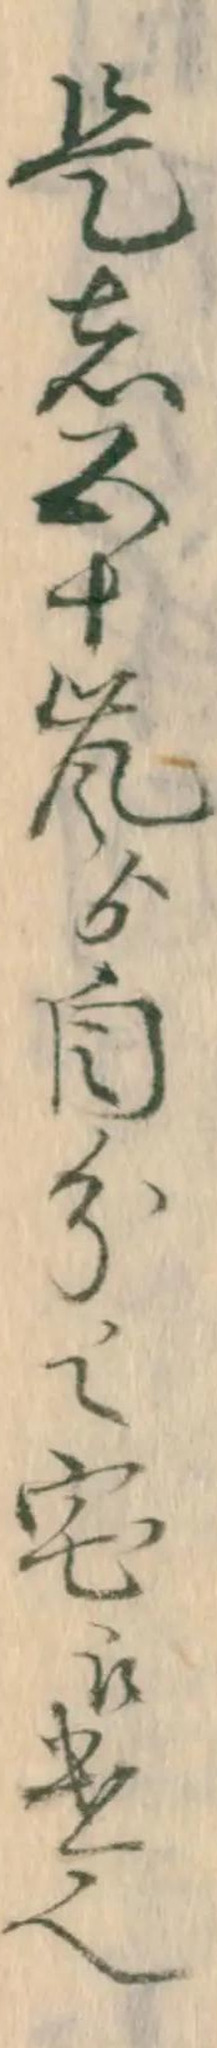是者五十嵐ゟ自分之宅江遣也
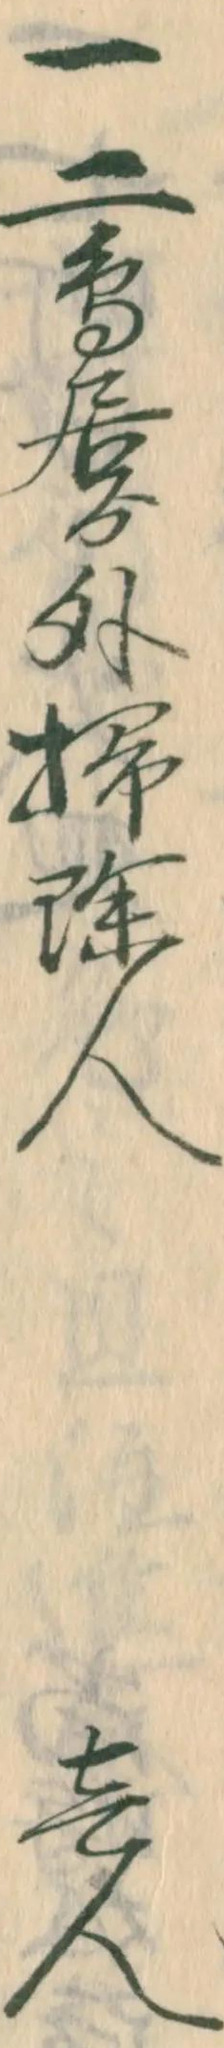一二鳥居ゟ外掃除人壱人
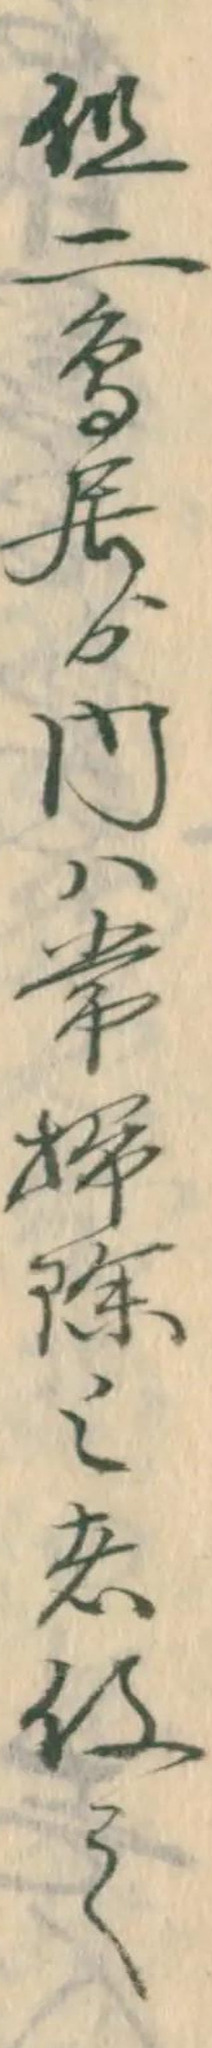但二鳥居ゟ内ハ常掃除之者役之

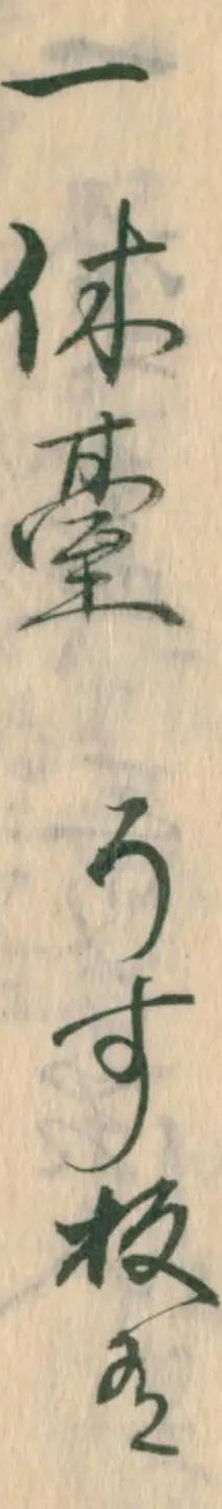一休台うす板有
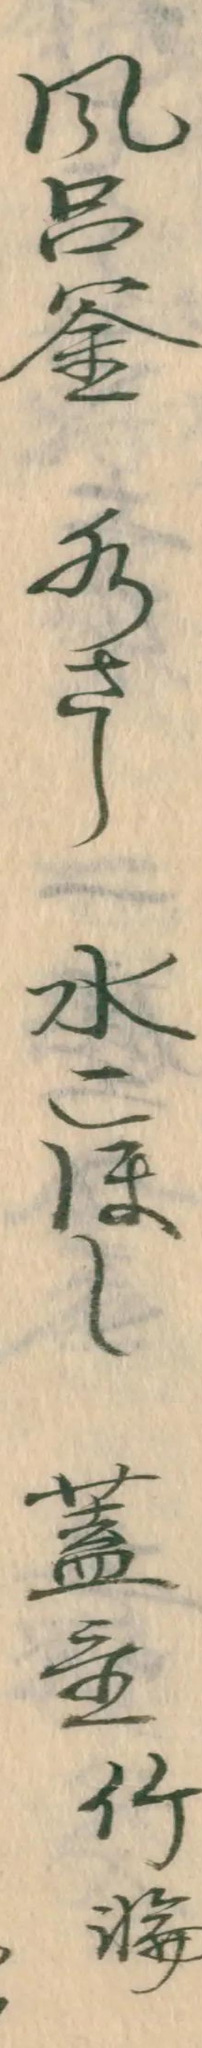風呂釜水さし水こほし蓋置竹輪
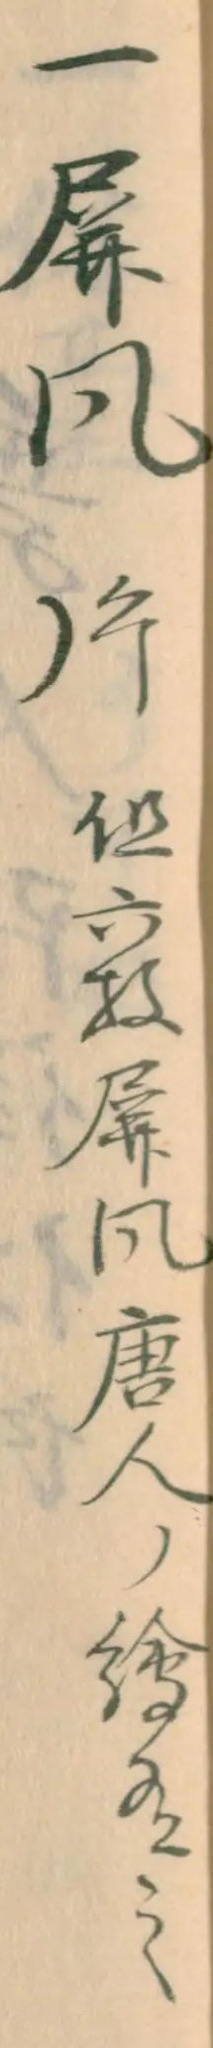一屏風片但六枚屏風唐人ノ絵有之
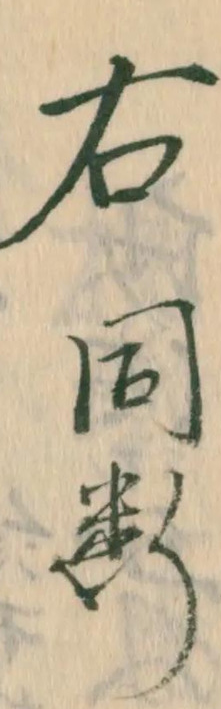右同断
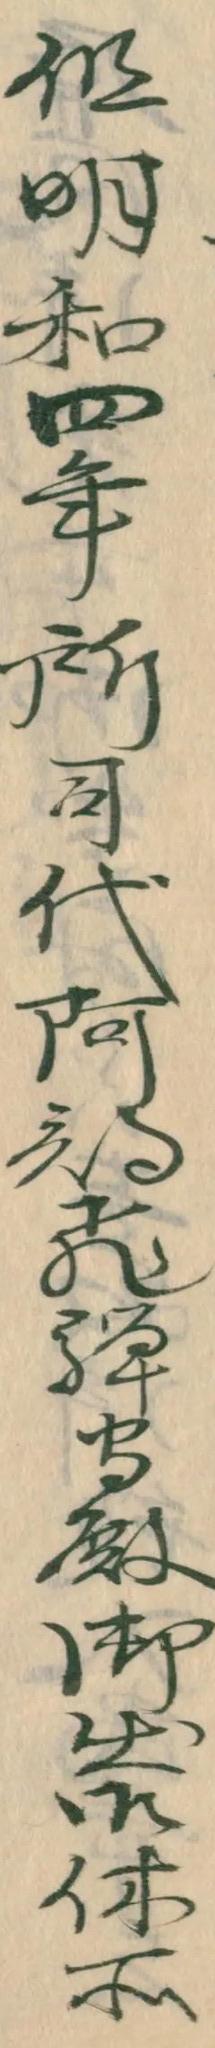但明和四年所司代阿部飛騨守殿御出御休所
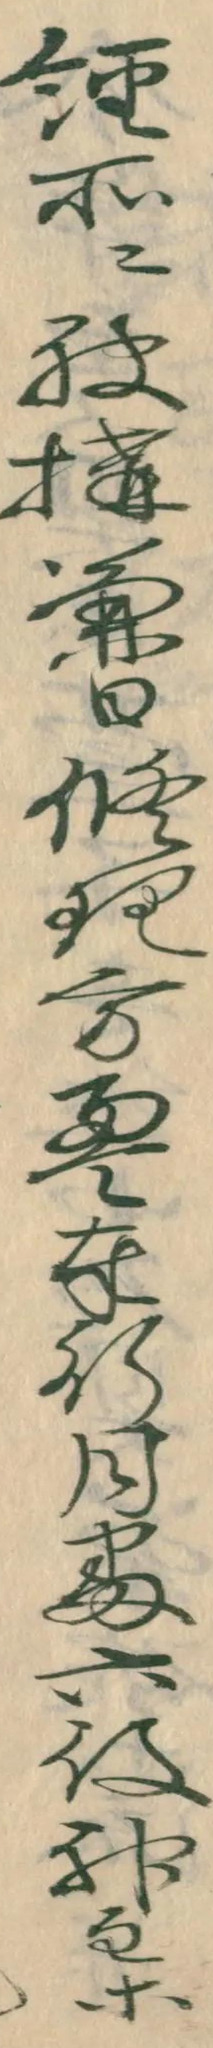経所ニ被構兼日修理方畳奉行月番六役神主等
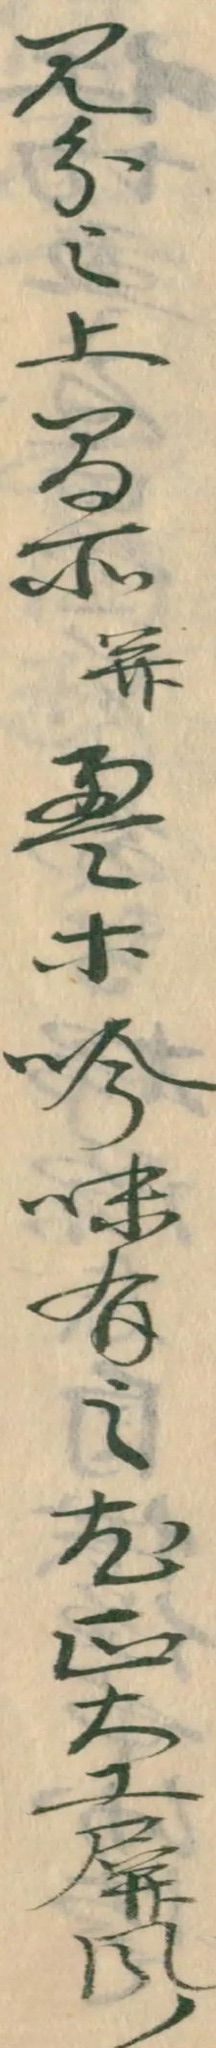見分之上間所并畳等吟味有之尤正大工屏風ノ

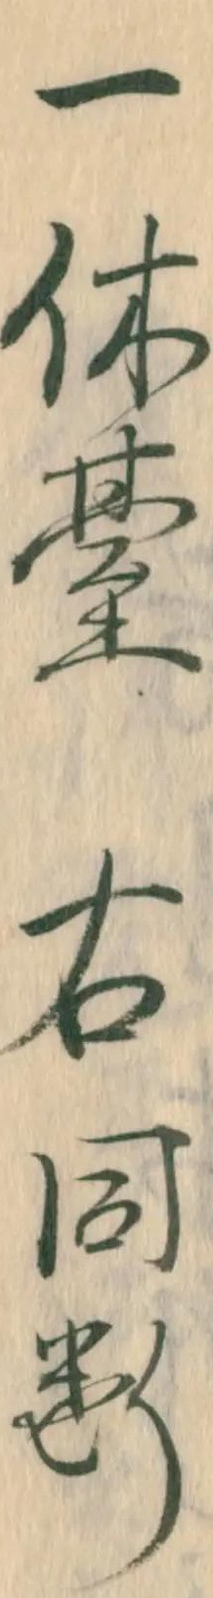一休台右同断
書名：賀茂社記録. 第6冊
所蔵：国立国会図書館 National Diet Library, JAPAN
